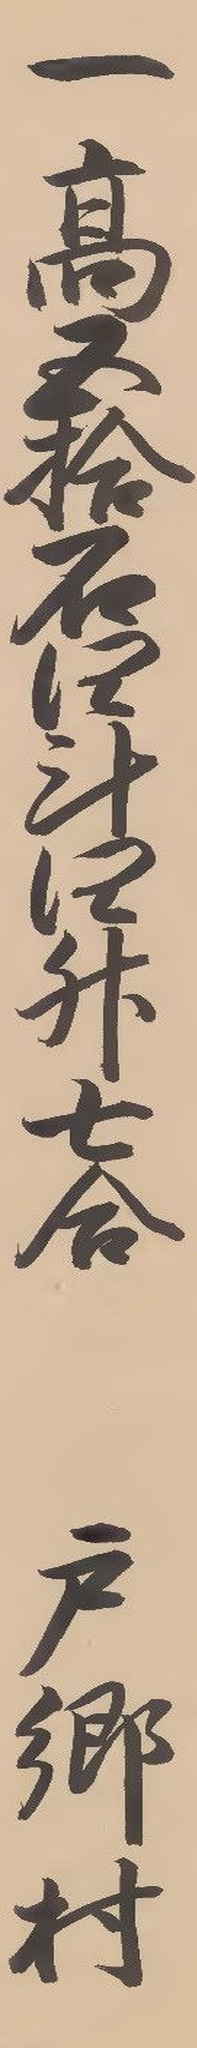一高五拾石四斗四升七合戸郷村
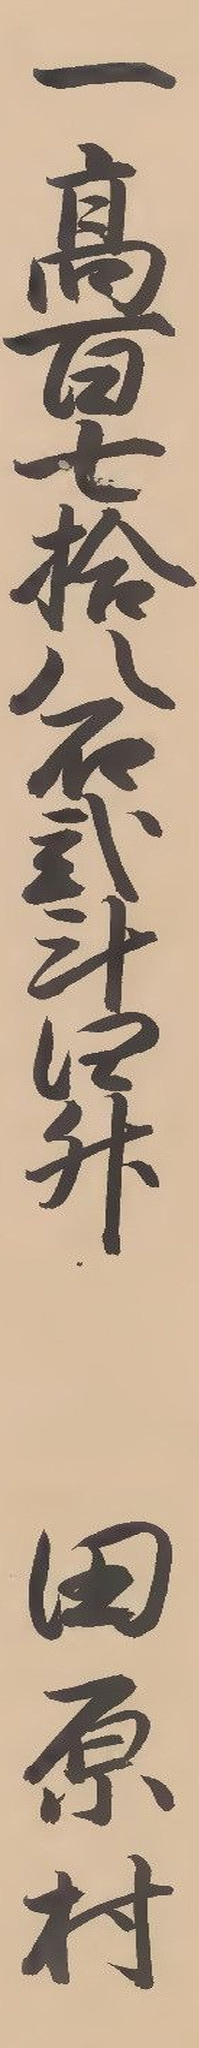一高百七拾八石弐斗四升田原村
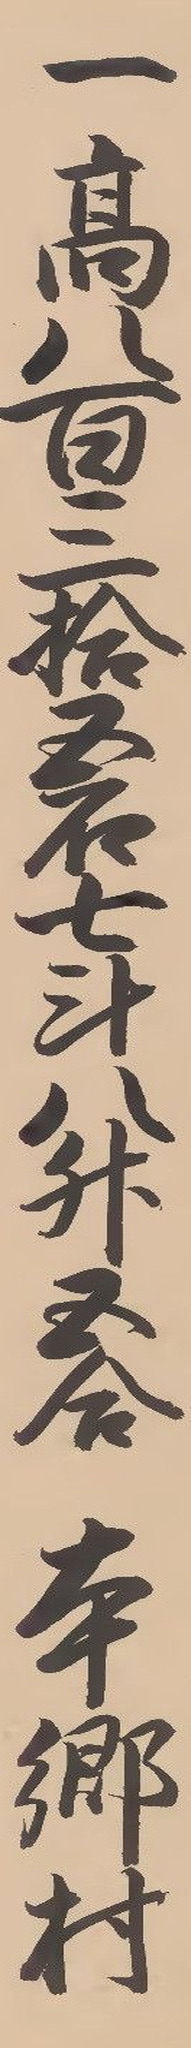一高八百三拾五石七斗八升五合本郷村
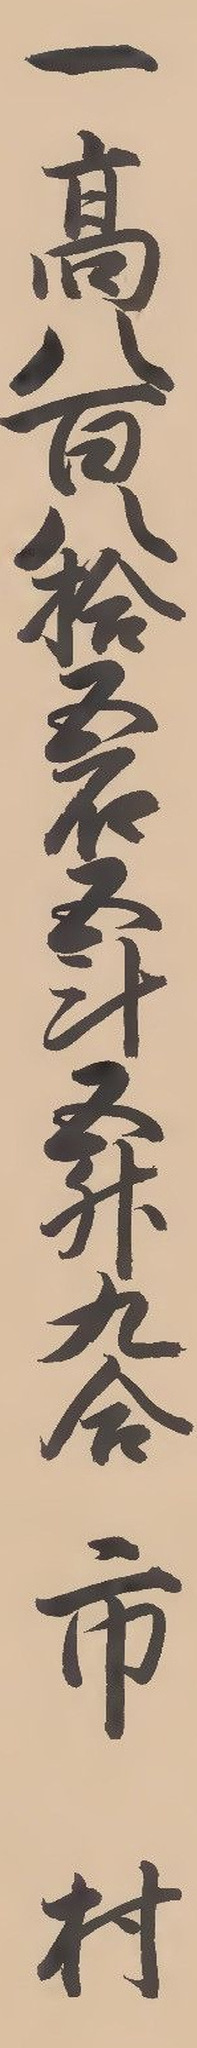一高八百八拾五石五斗五升九合市村
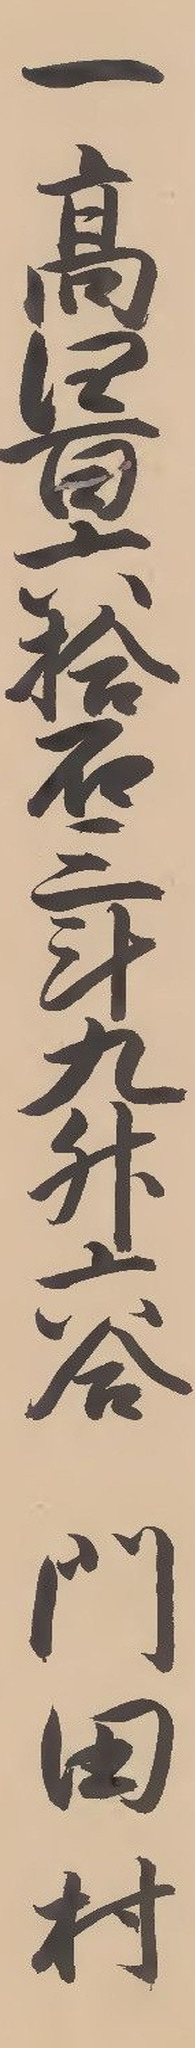一高四百六拾石三斗九升六合門田村
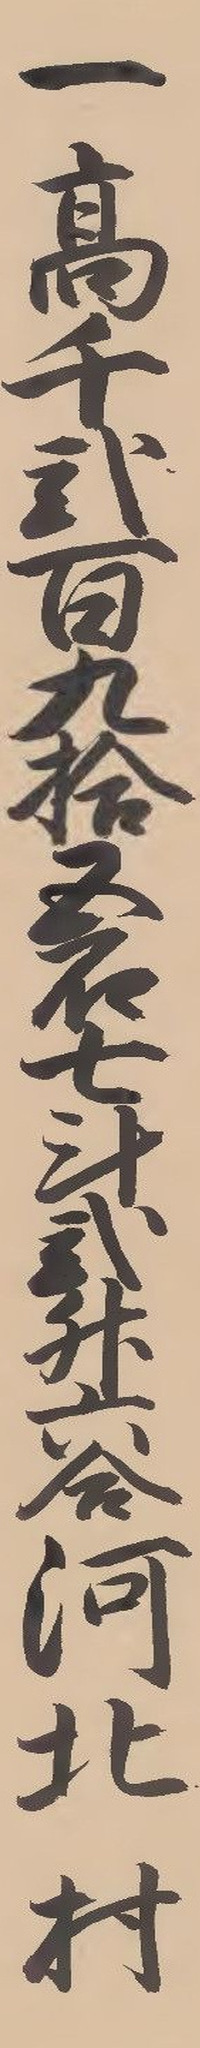一高千弐百九拾五石七斗弐升六合河北村
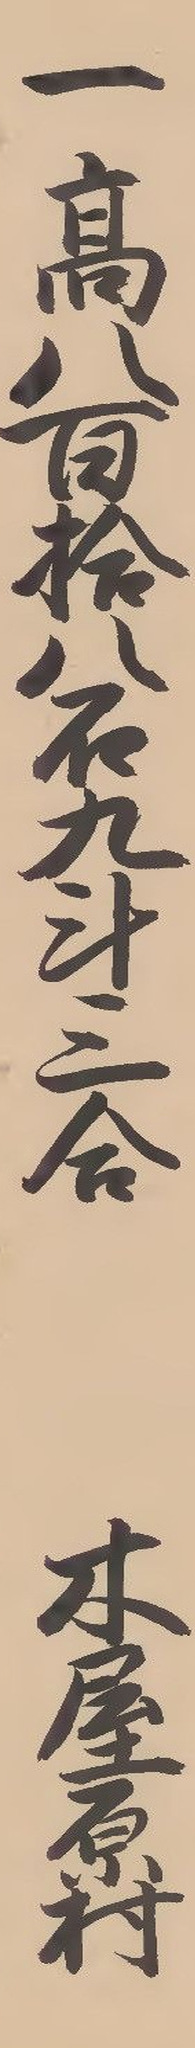一高八百拾八石九斗三合木屋原村

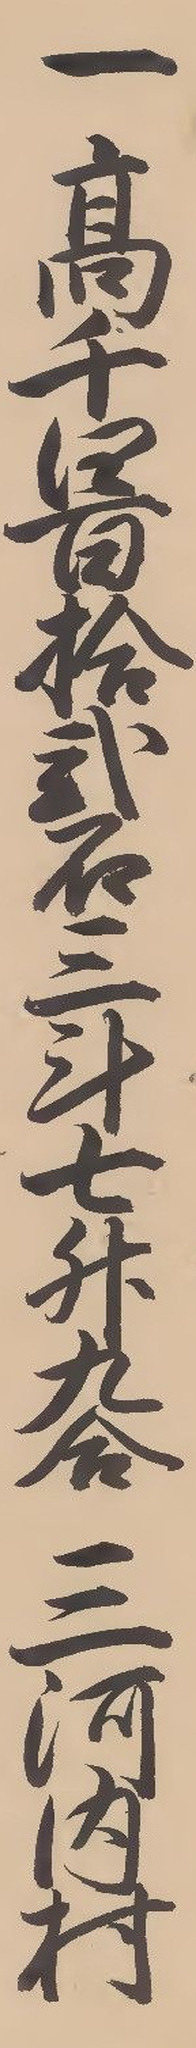一高千四百拾弐石三斗七升九合三河内村
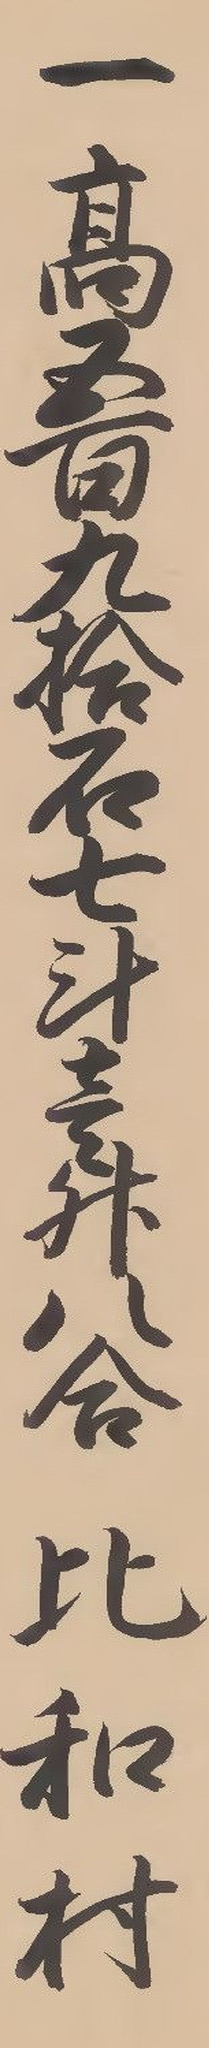一高五百九拾石七斗壱升八合比和村
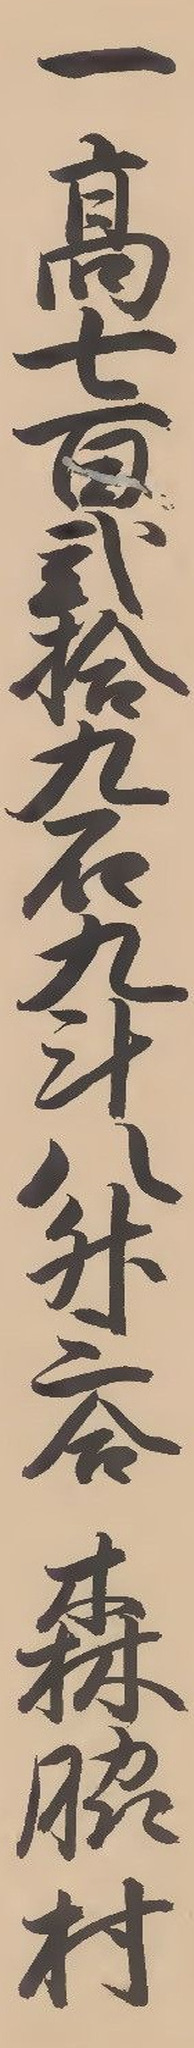一高七百弐拾九石九斗八升三合森脇村
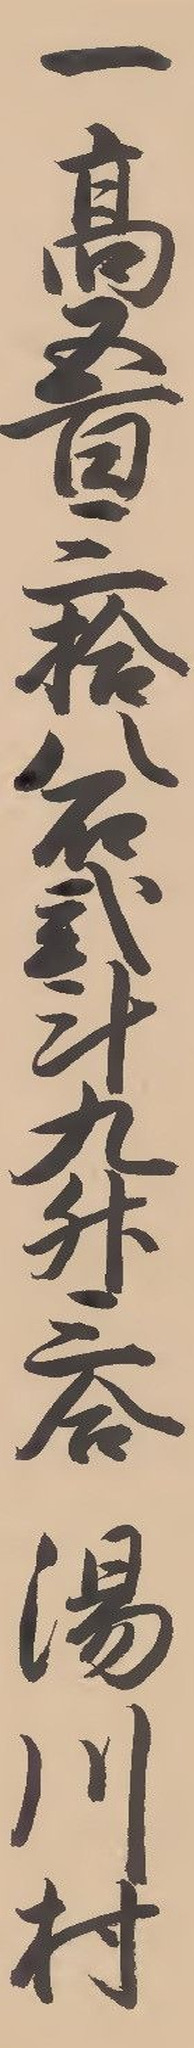一高五百三拾八石弐斗九升三合湯川村
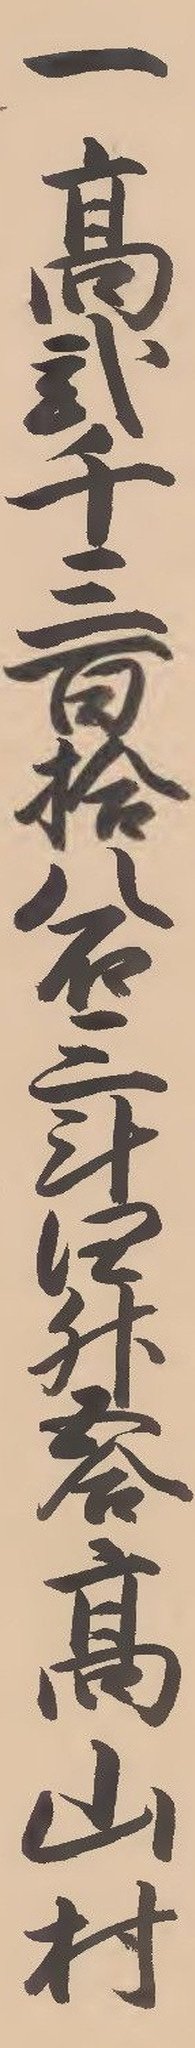一高弐千三百拾八石三斗四升五合高山村
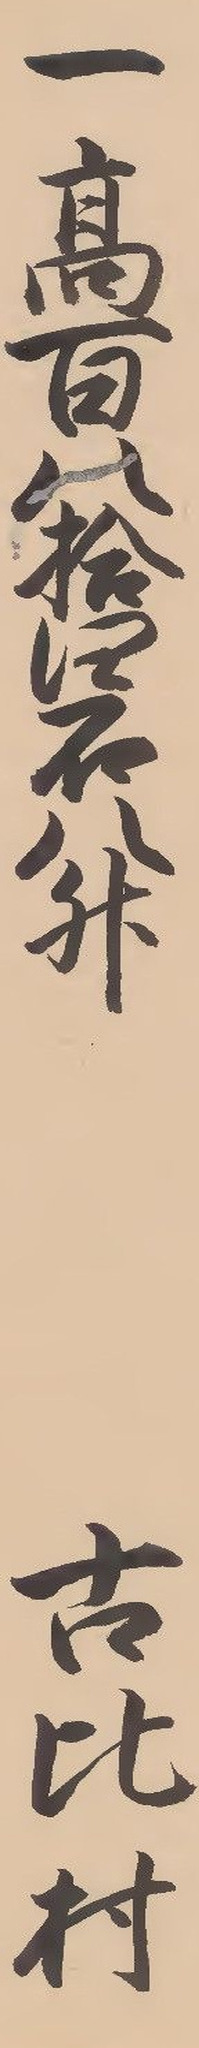一高百八拾四石八升古比村
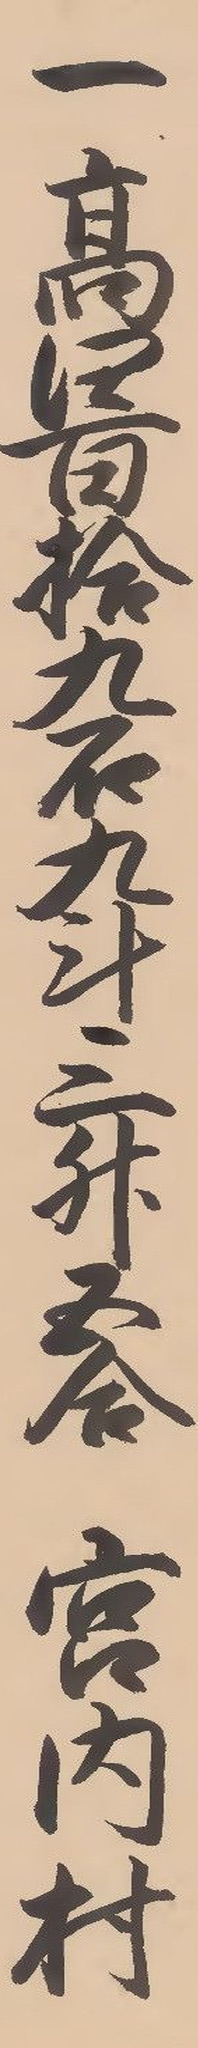一高四百拾九石九斗三升五合宮内村
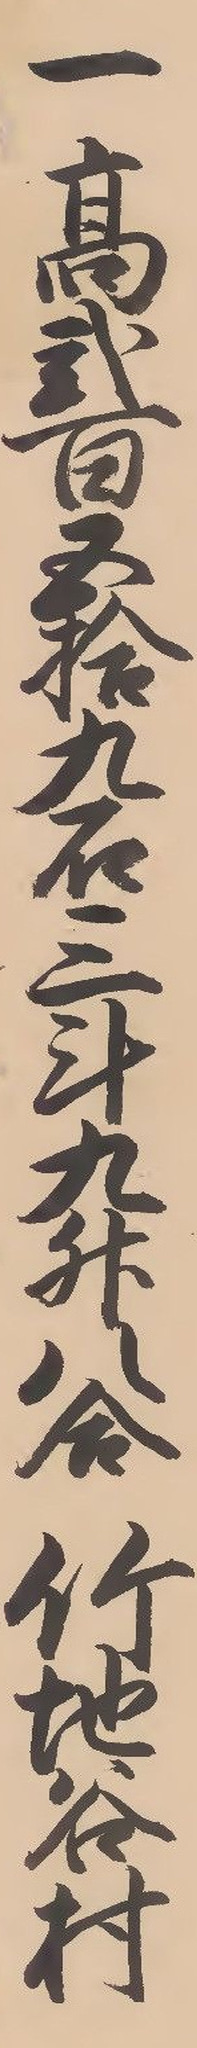一高弐百五拾九石三斗九升八合竹地谷村

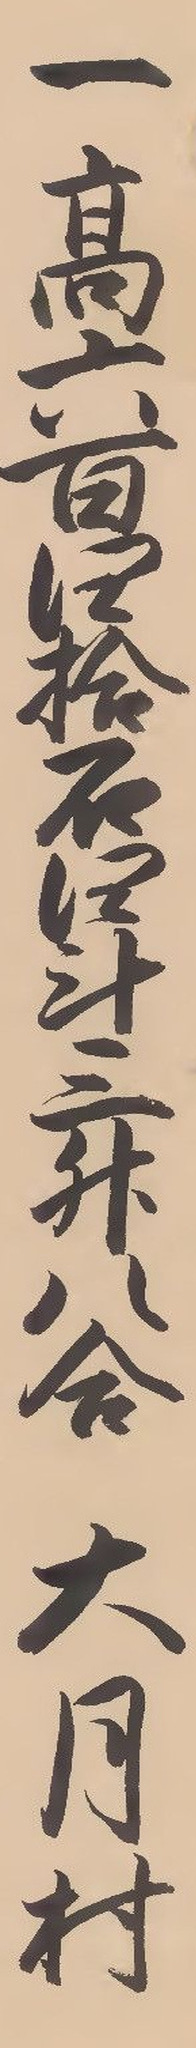一高六百四拾石四斗三升八合大月村
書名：備後国郷帳
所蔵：国立公文書館 National Archives of Japan
